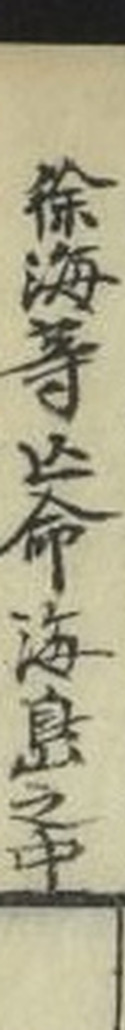徐海等亡命海島之中
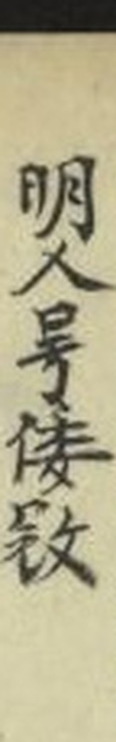明人号倭寇
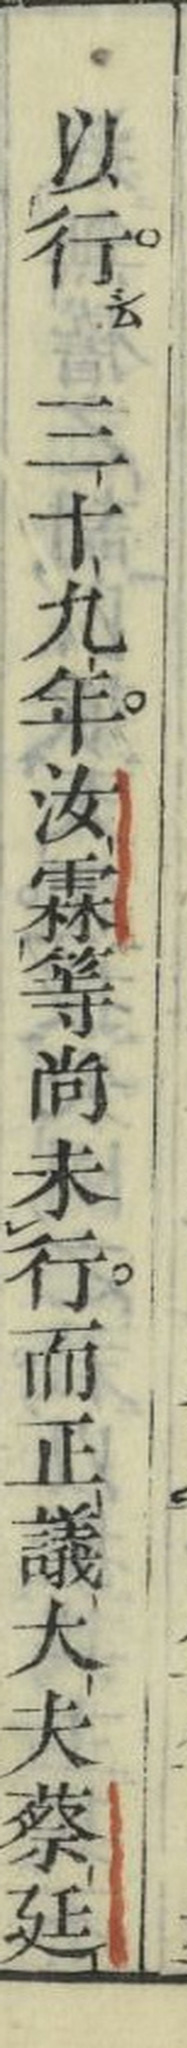以-行。三-十-九-年。汝-霖-等尚未行。而正-議-大-夫蔡-廷-

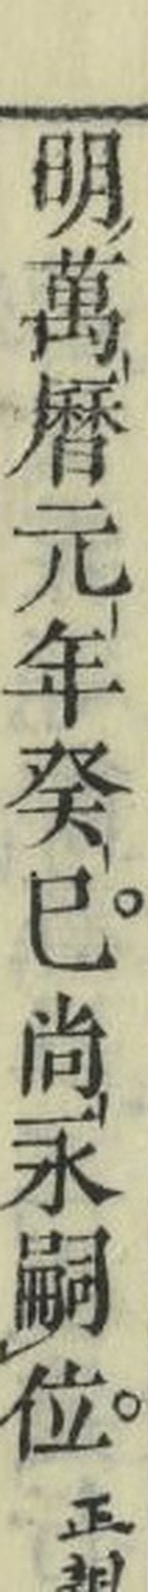明万-暦元-年癸-巳。尚-永嗣位。
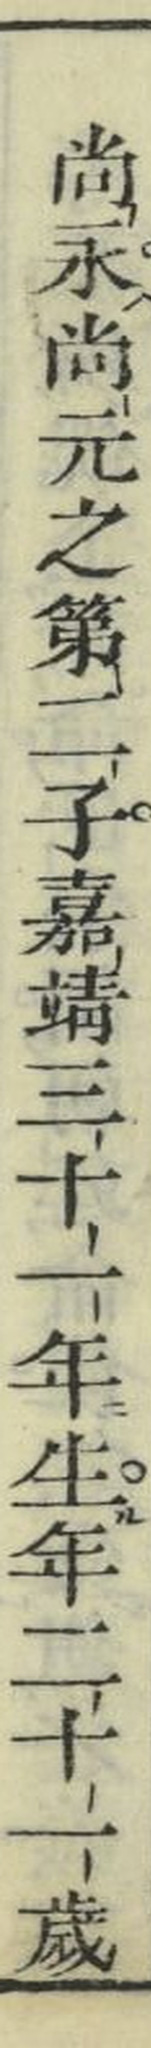尚-永。尚-元之第-二-子。嘉-靖三-十-一-年生。年二-十-一-歳

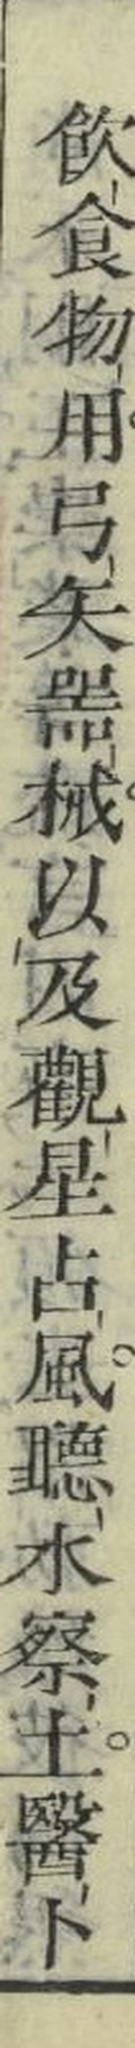飲-食物-用。弓-矢器-械。以-及観-星占-風。聴-水察-土。医-卜

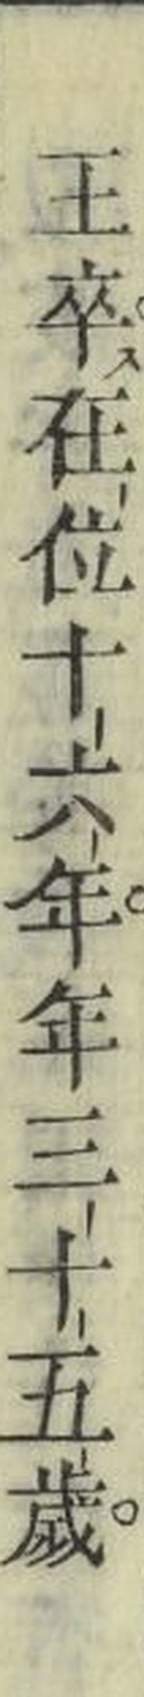王卒。在-位十-六-年。年三-十-五-歳。
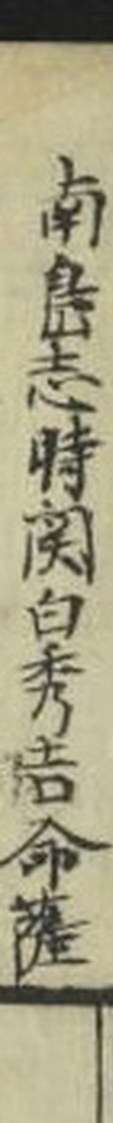南島志時関白秀吉命薩
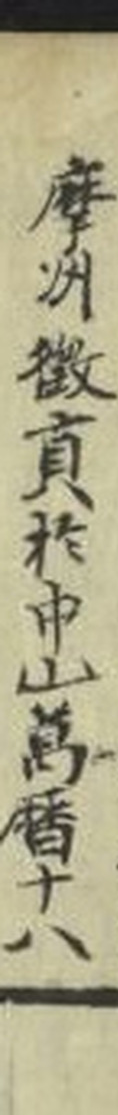摩州徴貢於中山万暦十八
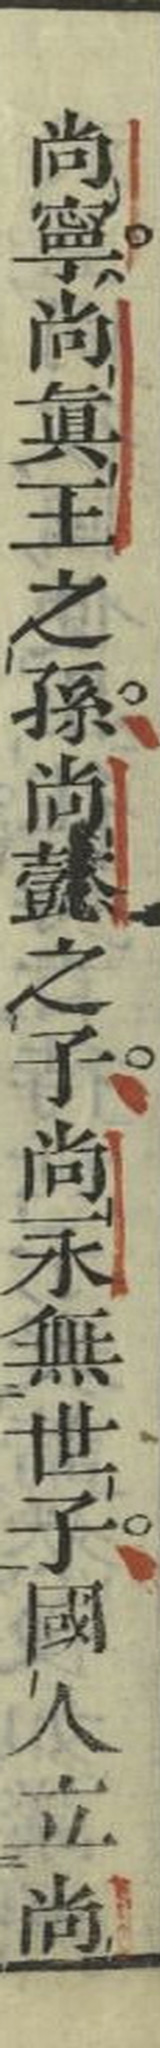尚-寧。尚-真-王之-孫。尚-懿之-子。尚-永無世-子。国-人立尚-
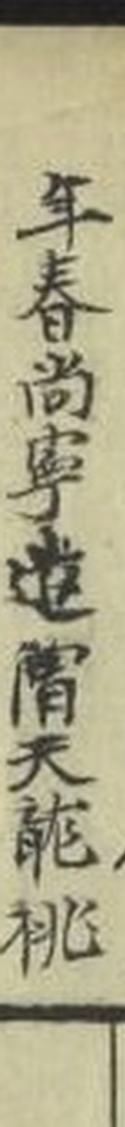年春尚寧遣僧天竜桃
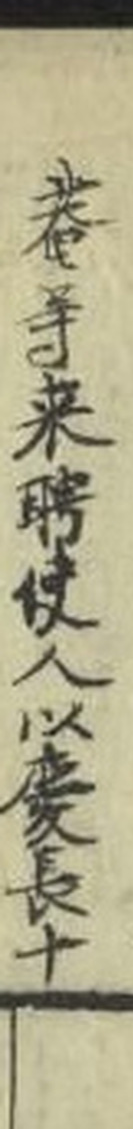菴等来聘使人以慶長十
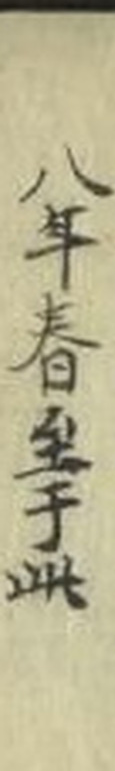八年春至于此

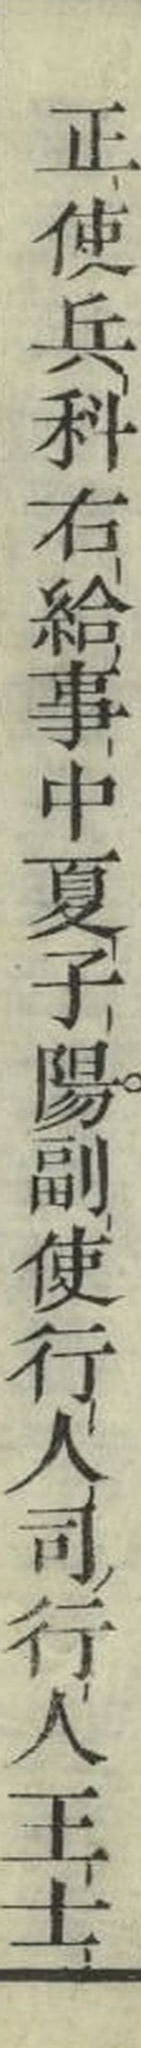正-使兵-科右-給-事-中夏-子-陽。副-使行-人-司行-人王-士-

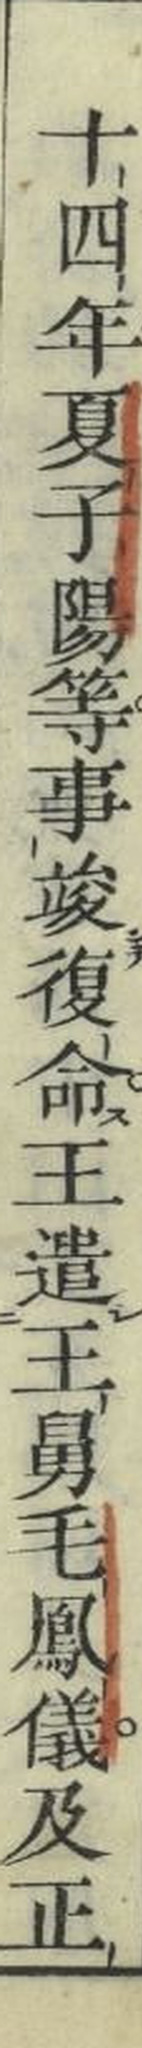十-四-年。夏-子-陽等。事-竣復-命。王遣王-舅毛-鳳-儀。及正-
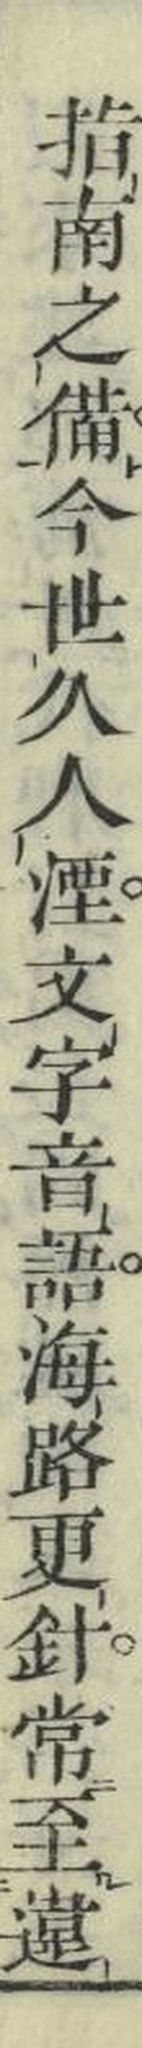指-南之-備。今世-久人-湮。文-字音-語。。海-路更-針。常至違-
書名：中山伝信録 巻三
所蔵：University of the Ryukyus Library
